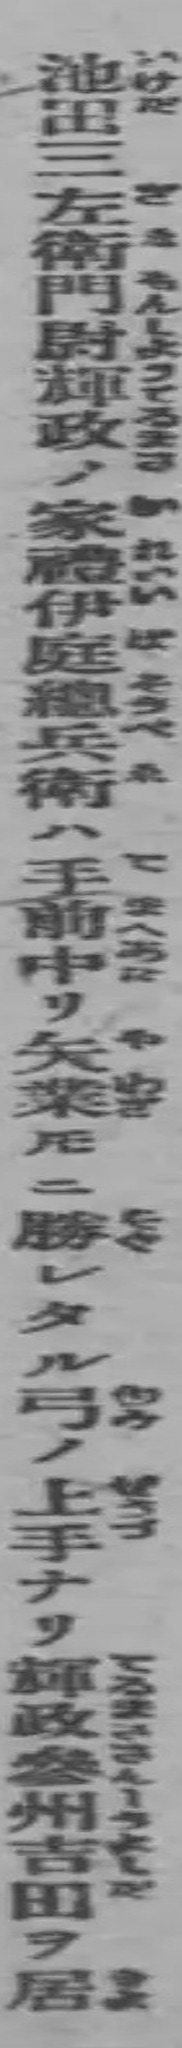池田三左衛門尉輝政ノ家礼伊庭総兵衛ハ手前中リ矢業モノニ勝レタル弓ノ上手ナリ輝政参州吉田ヲ居
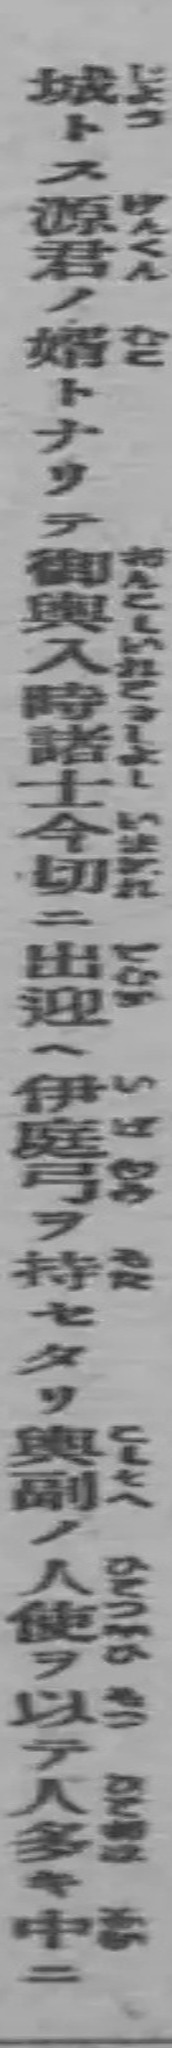城トス源君ノ婿トナリテ御輿入時諸士今切に出迎ヘ伊庭弓ヲ持セタリ輿副ノ人使ヲ以テ人多キ中ニ
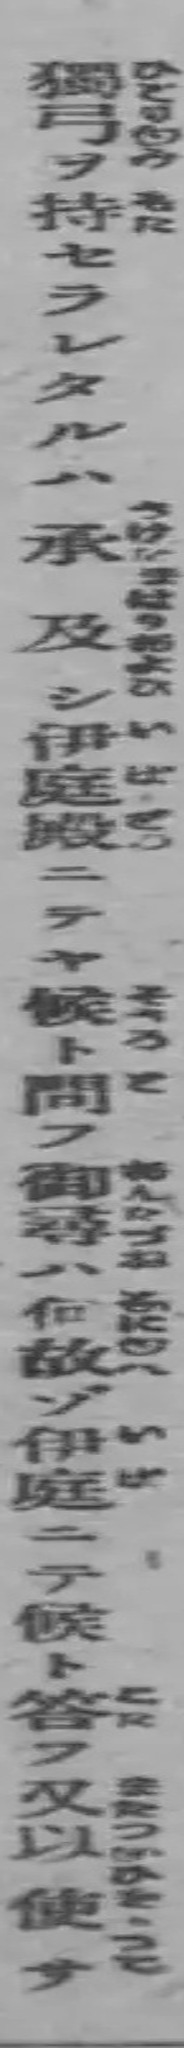独弓ヲ持セラレタルハ承及シ伊庭殿ニテヤ候ト問フ御尋ハ何故ゾ伊庭ニテ候ト答フ又以使サ
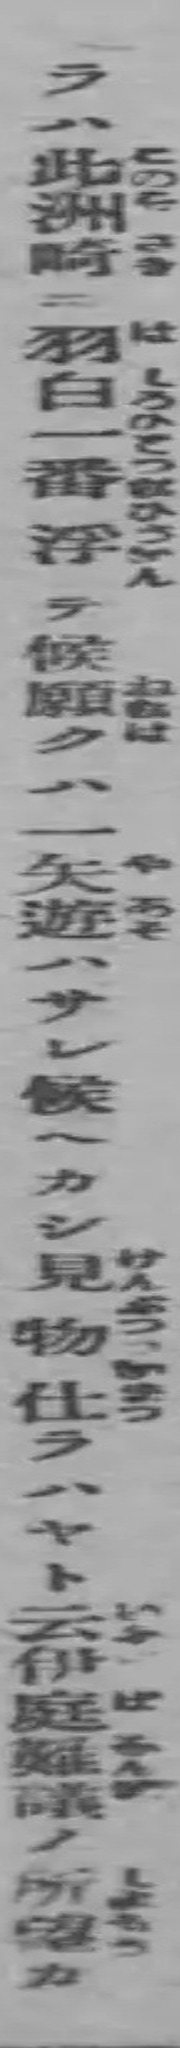ラハ此洲崎ニ羽白一番浮テ候願クハ一矢遊ハサレ候ヘカシ見物仕ラハヤト云伊庭難議ノ所望カ
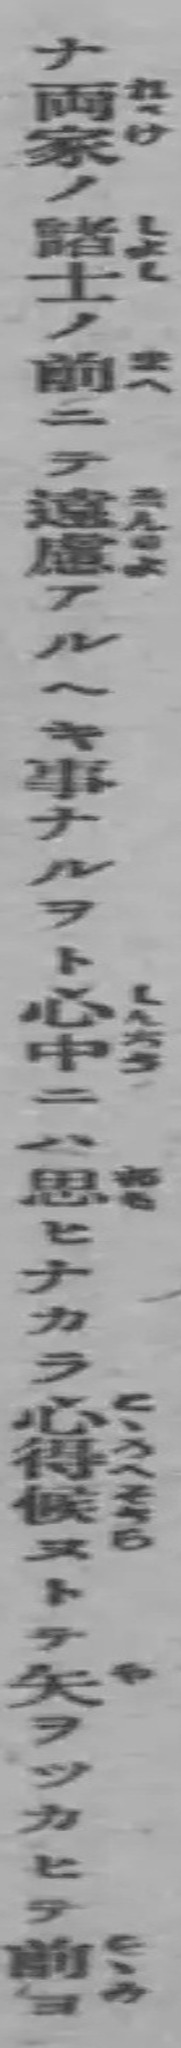ナ両家ノ諸士ノ前ニテ遠慮アルヘキ事ナルヲト心中ニハ思ヒナカラ心得候ヌトテ矢ヲツカヒテ前ヨ
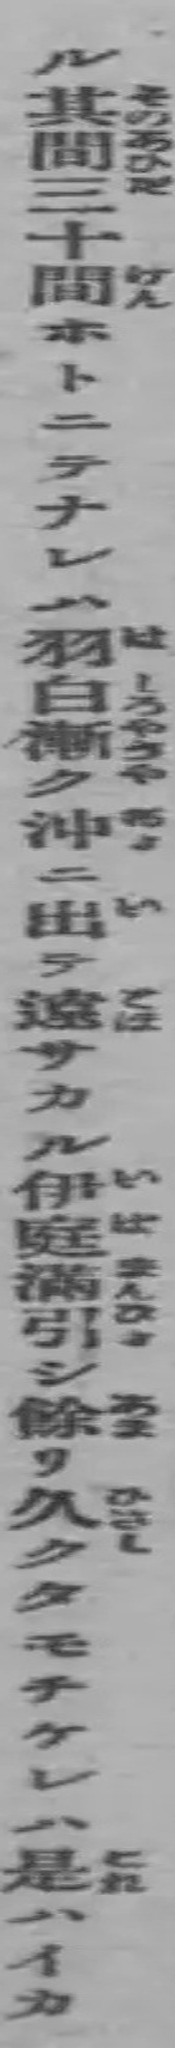ル其間三十間ホトニテナレハ羽白漸ク沖ニ出テ遠サカル伊庭満引シ余リ久クタモチケレハ是ハイカ
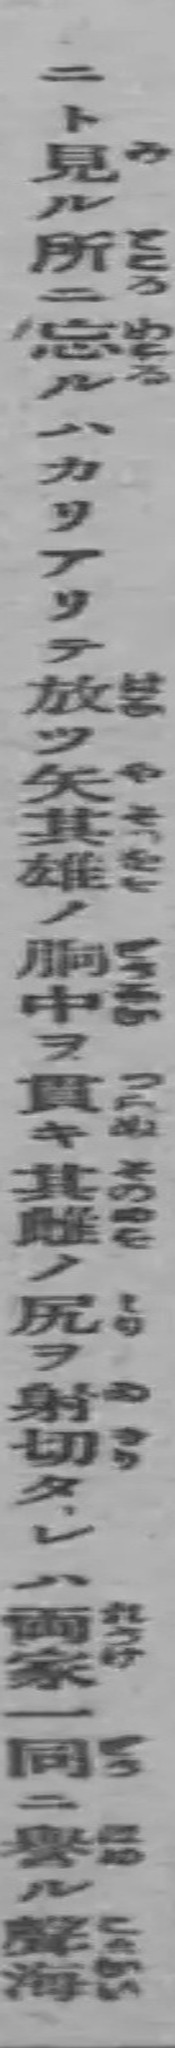ニト見ル所ニ忘ルハカリアリテ放ツ矢其雄ノ胴中ヲ貫キ其雌ノ尻ヲ射切タレハ両家一同ニ誉ル声海
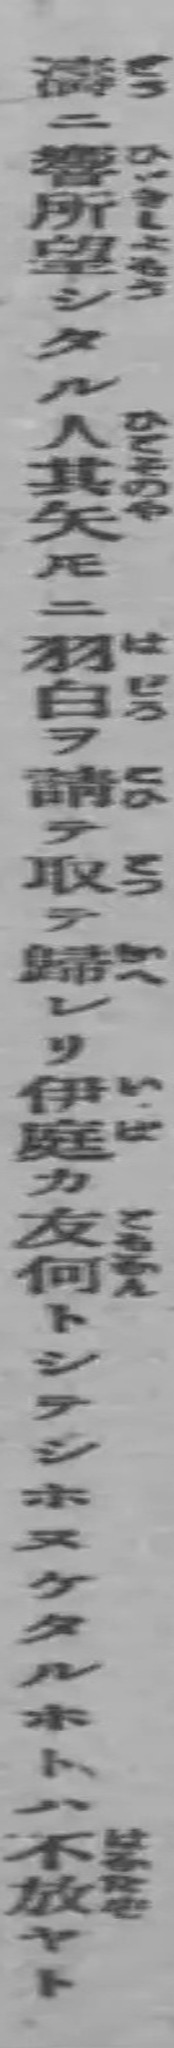涛ニ響所望シタル人其矢トモニ羽白ヲ請テ取テ帰レリ伊庭カ友何トシテシホヌケタルホトハ不放ヤト
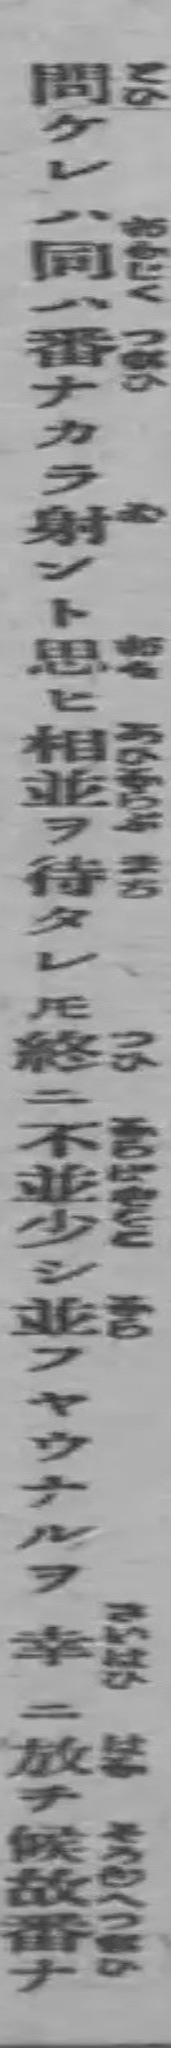問ケレハ同ハ番ナカラ射ント思ヒ相並ヲ待タレトモ終ニ不並少シ並フヤウナルヲ幸ニ放チ候故番ナ
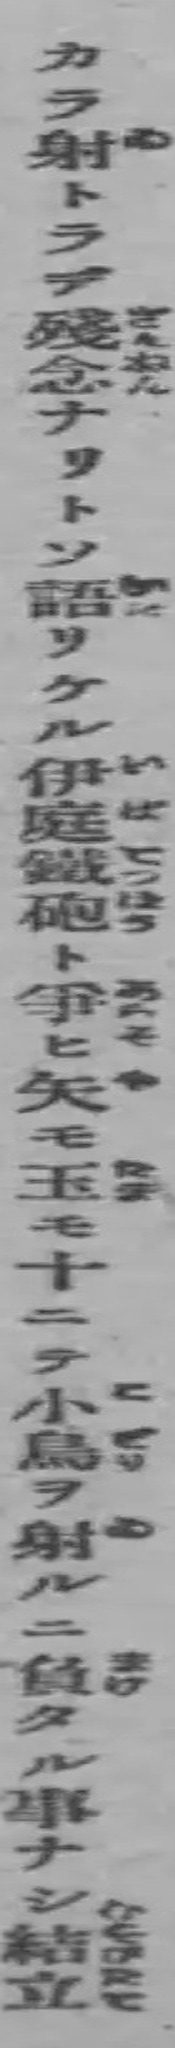カラ射トラデ残念ナリトソ語リケル伊庭鉄砲ト争ヒ矢モ玉モ十ニテ小鳥ヲ射ルニ負タル事ナシ結立
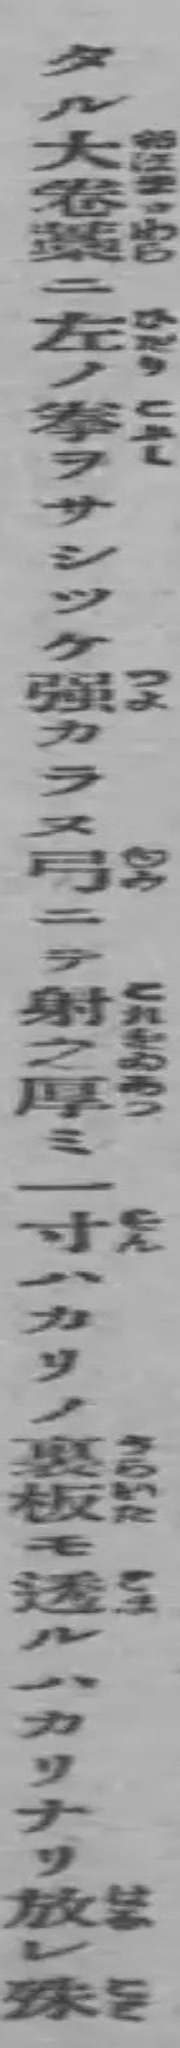タル大巻藁ニ左ノ拳ヲサシツケ強カラヌ弓ニテ射之厚ミ一寸ハカリノ裏板モ透ルハカリナリ放レ殊
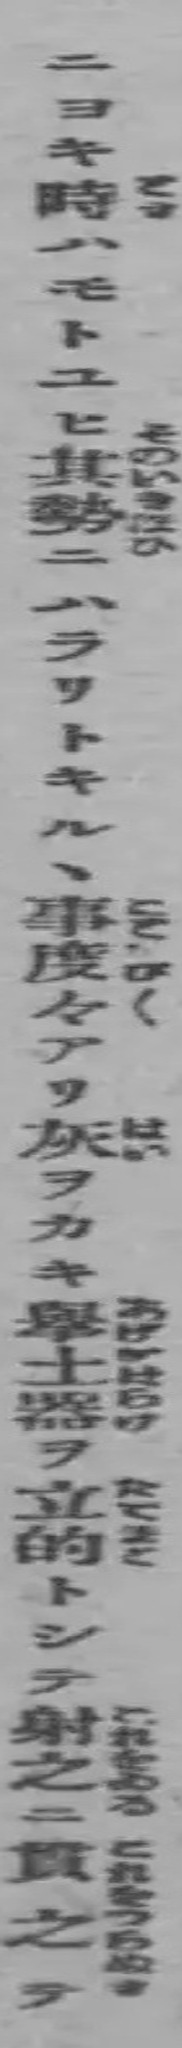ニヨキ時ハモトユヒ其勢ニハラリトキルヽ事度々アリ灰ヲカキ挙土器ヲ立的トシテ射之ニ貫之テ
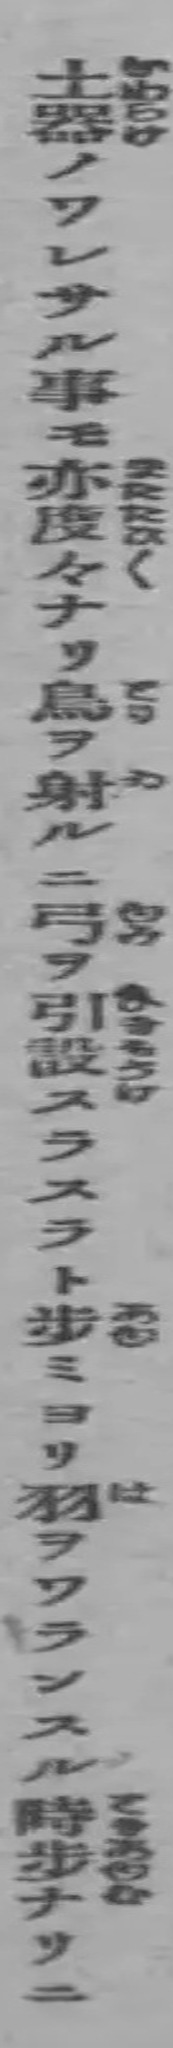土器ノワレサル事モ亦度々ナリ鳥ヲ射ルニ弓ヲ引設スラスラト歩ミヨリ羽ヲワランスル時歩ナリニ
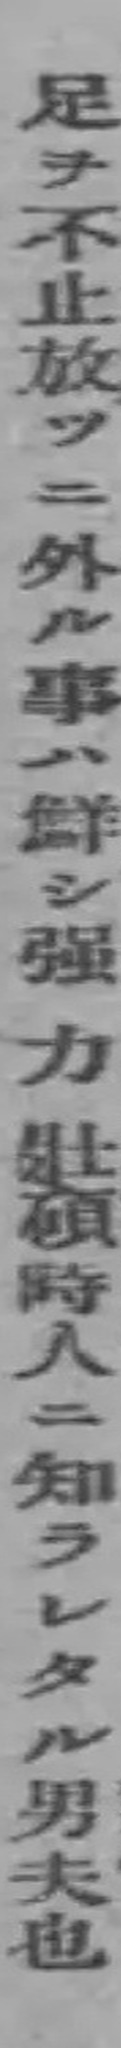足ヲ不止放ツニ外ル事ハ鮮シ強力壮碩時人ニ知ラレタル男夫也

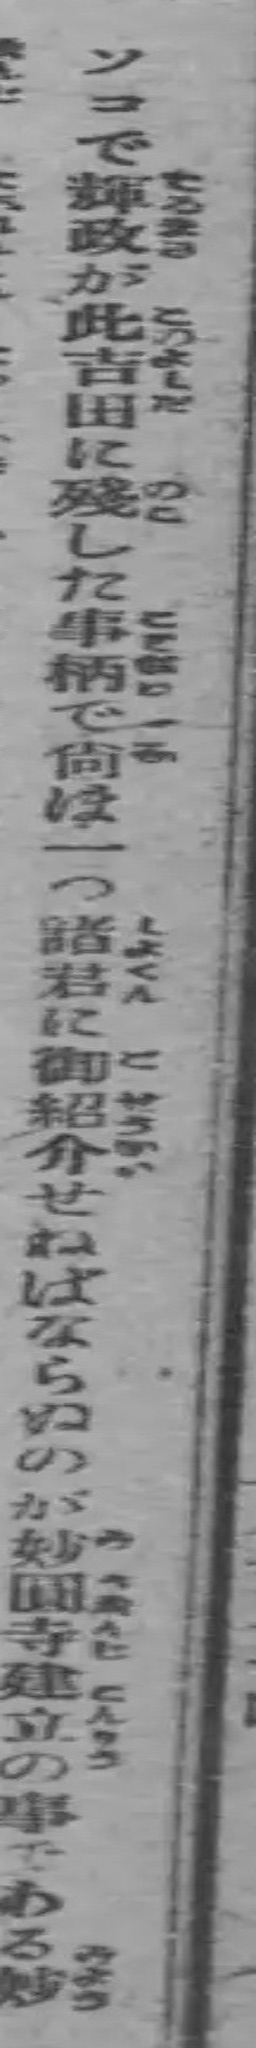ソコで輝政が此吉田に残した事柄で尚ほ一つ諸君に御紹介せねばならぬのが妙円寺建立の事である妙
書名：豊橋市史談
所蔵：国立国会図書館 National Diet Library, JAPAN
